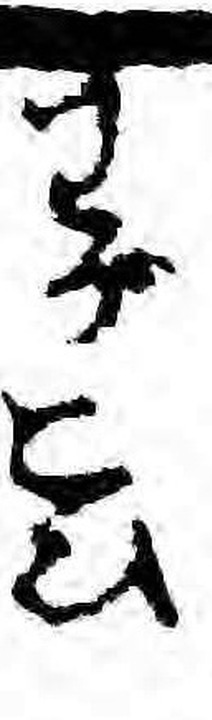わがこひ
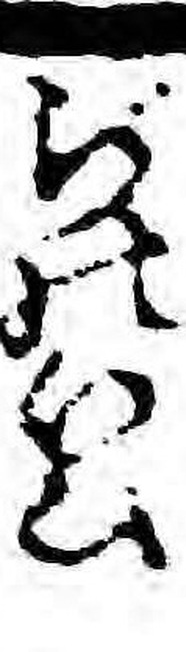ぢのいひ
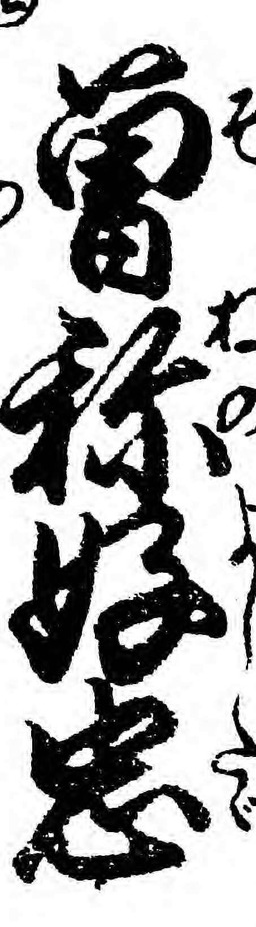曽根好忠
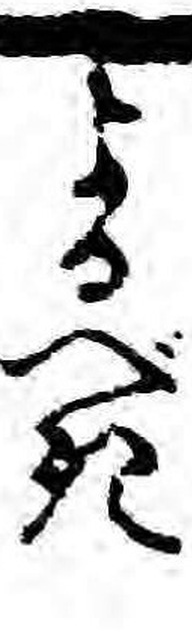よるべき
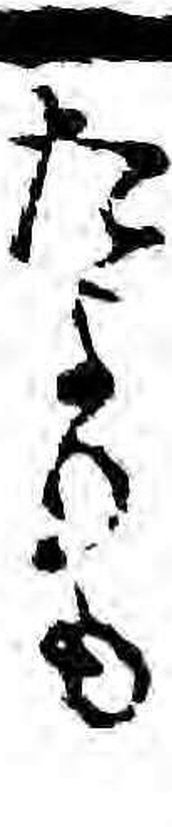たよりも
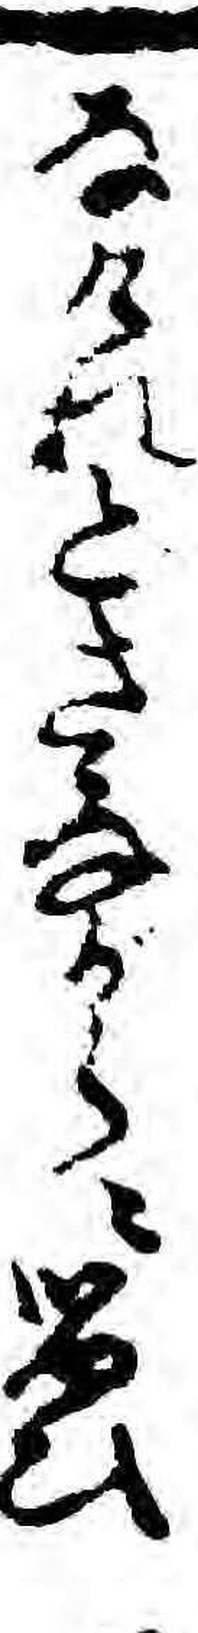なけれとさながらに思ひ
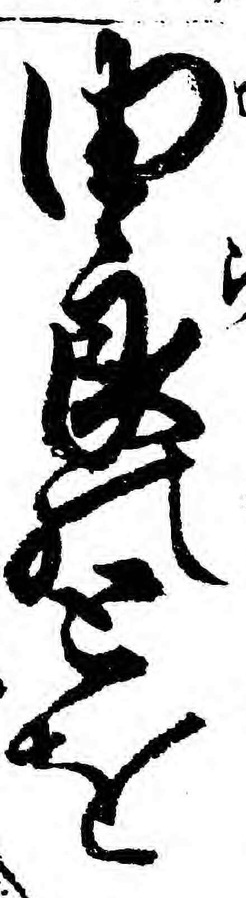由良のとを
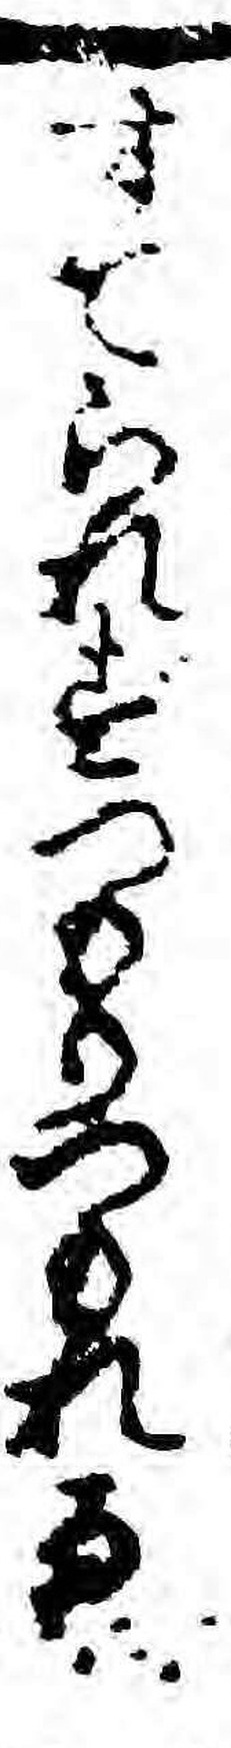すてられずつもりつもれる
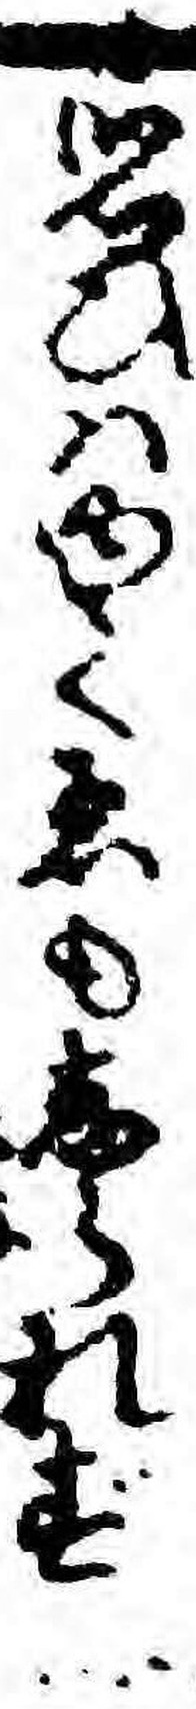思ひはゆくゑもしられず
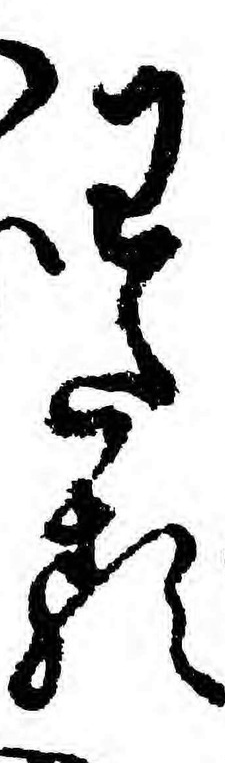わたる
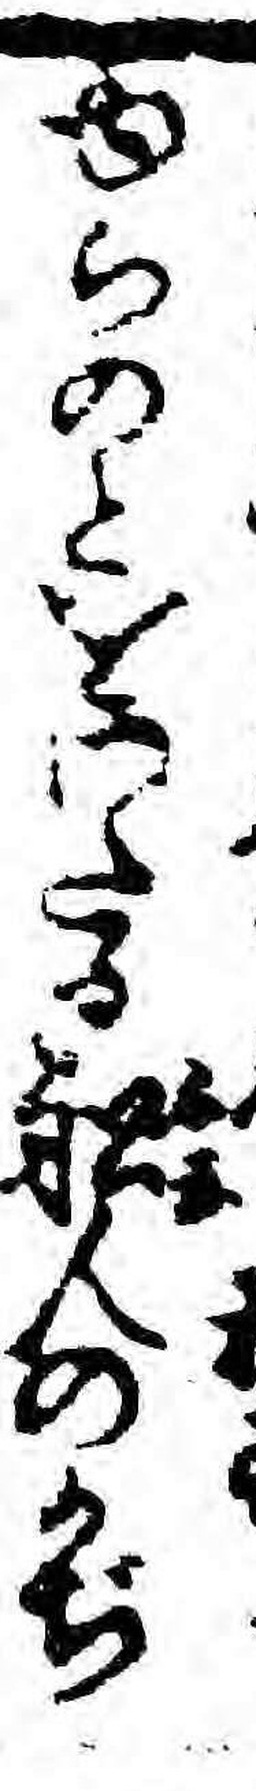ゆらのとをわたる船人のかぢ
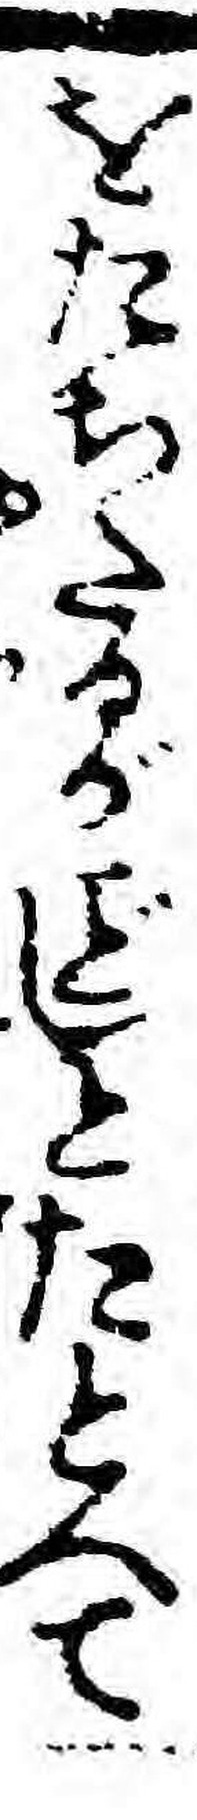をたちたるがごとしとたとへて
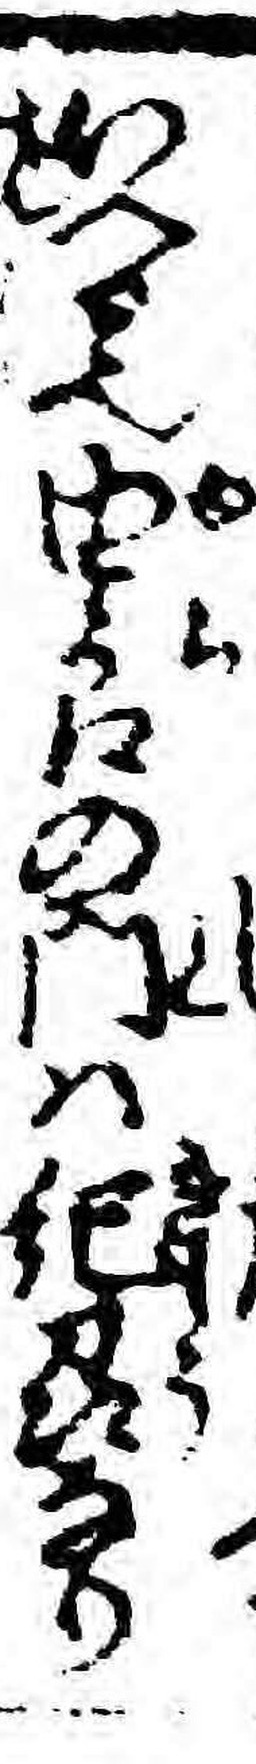いへる也由良の門は紀州なり
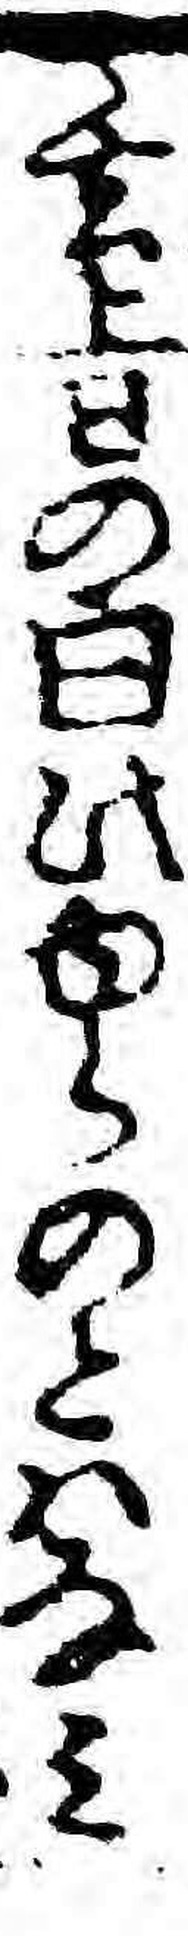玄旨の曰此ゆらのとはなみ
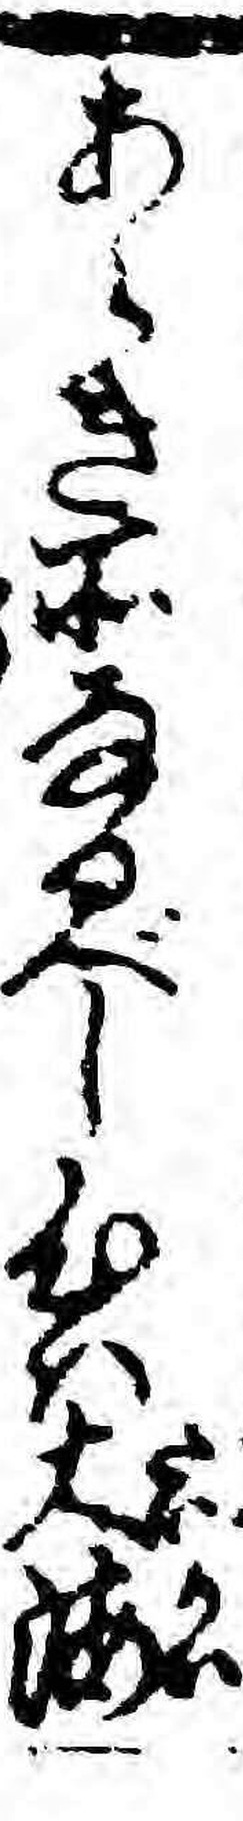あらき所なるべし心は大海
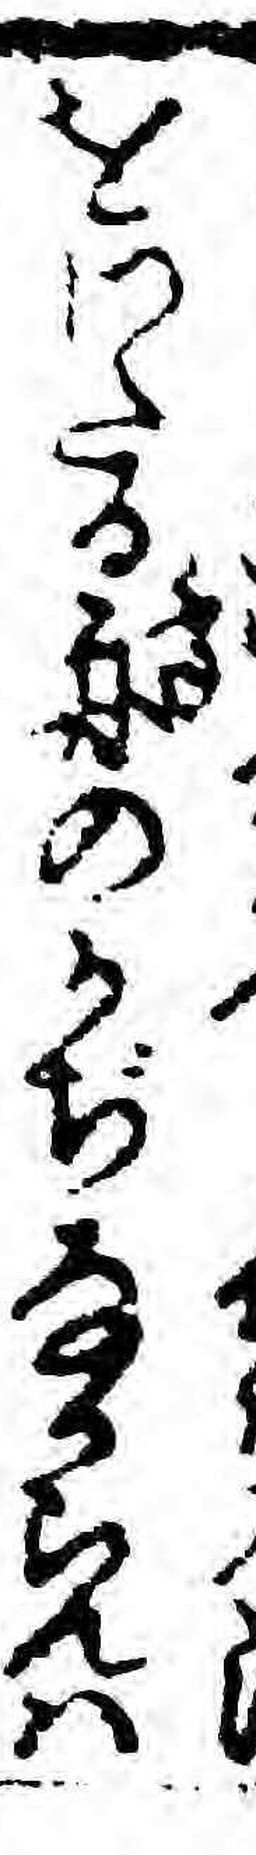をわたる舟のかぢなからんは
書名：頭書和歌注譯／壽賀多百人一首小倉錦
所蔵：国文学研究資料館
